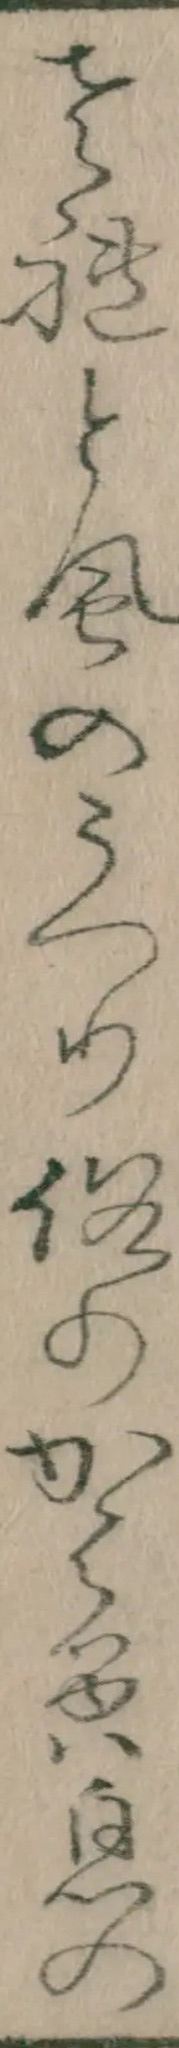されと風のうつり俗のかはるは息の

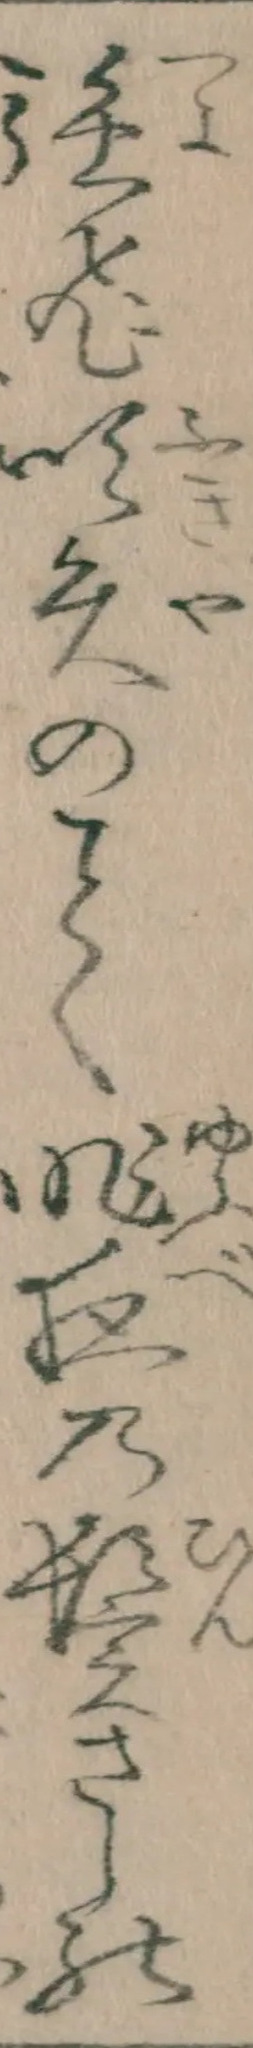強飛吹矢のことく昨夜の鬢さしの
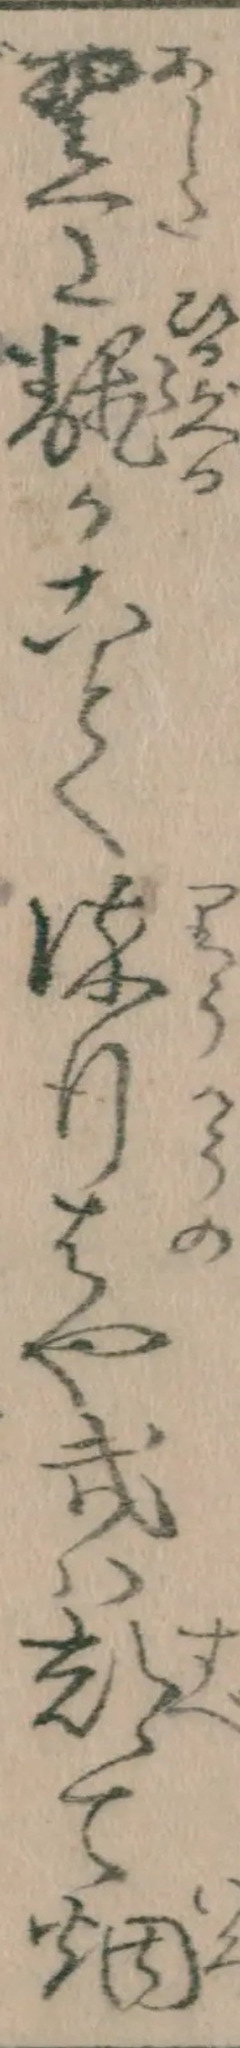翌に翻かことく流行はやきは都て煙
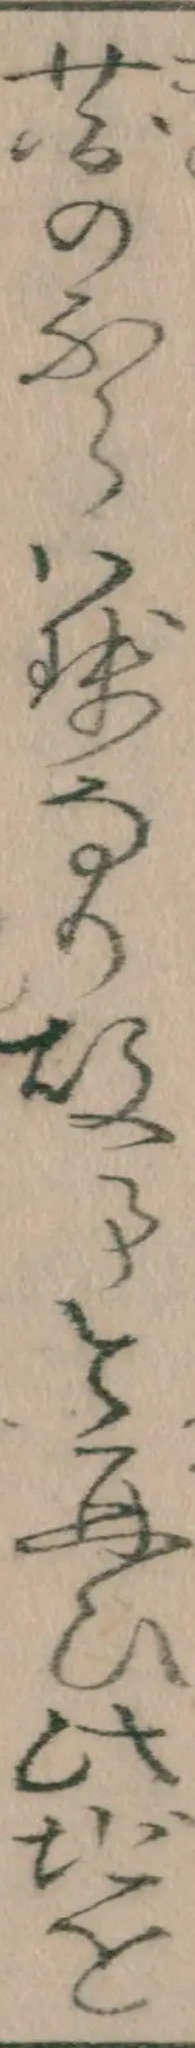花のならはせなり故に今再ひ此地を
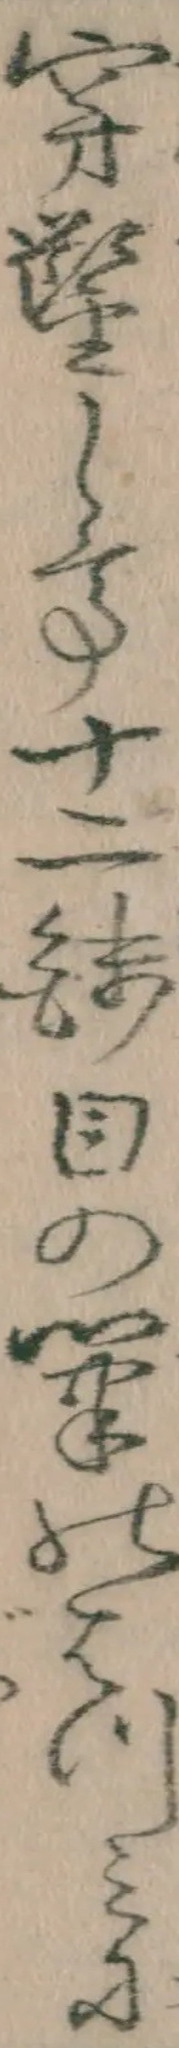穿鑿して十二銭目の筆のはつみに
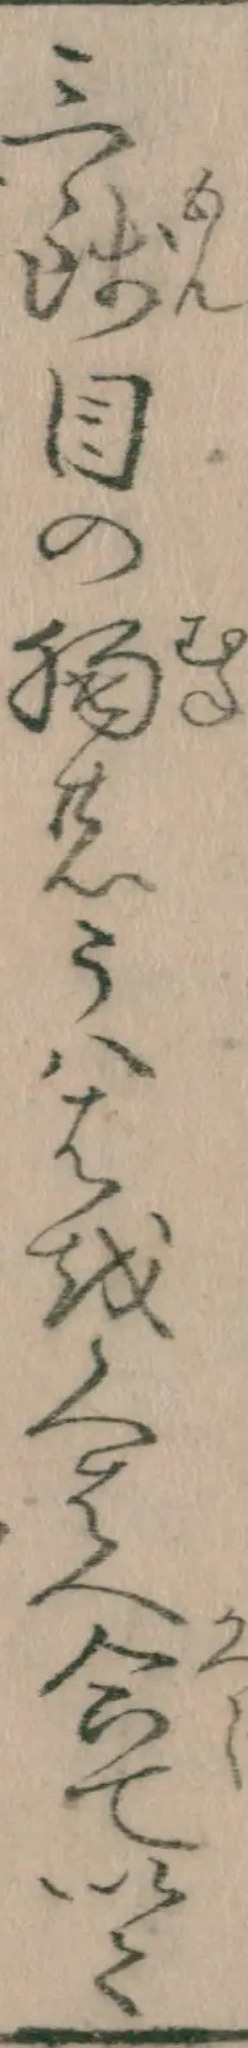三銭目の胸のうはを人はへ合ていて
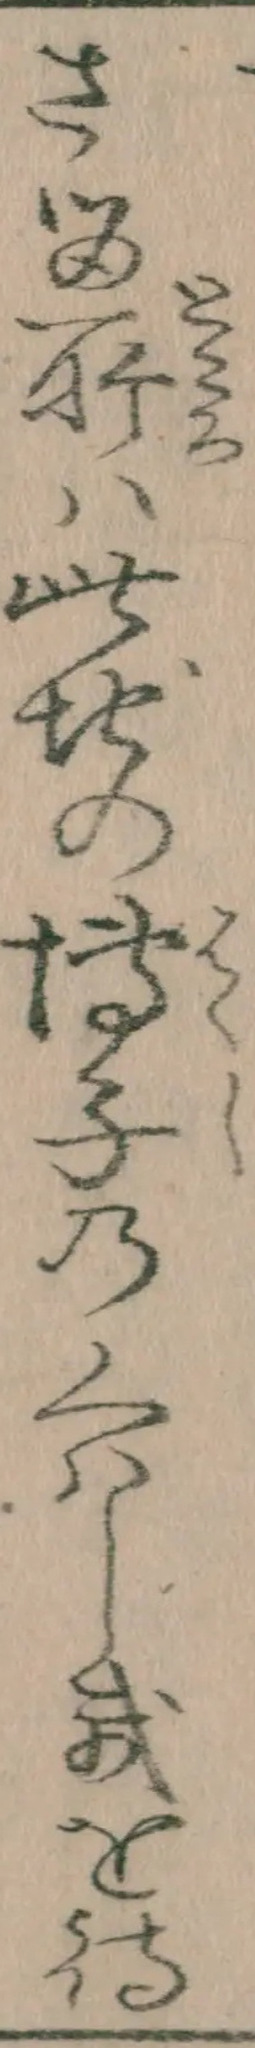さる所は此地の博子のくはしきを待
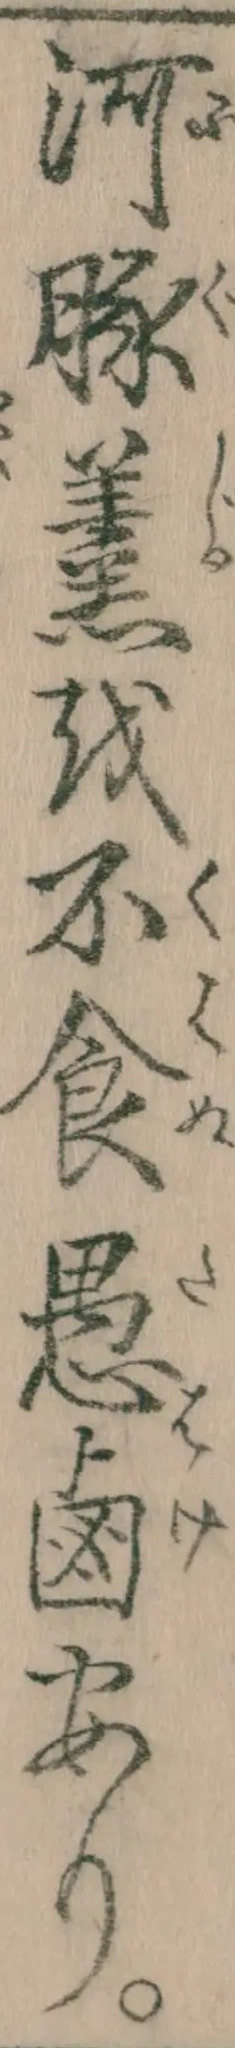河豚羹を不食愚鹵あり。
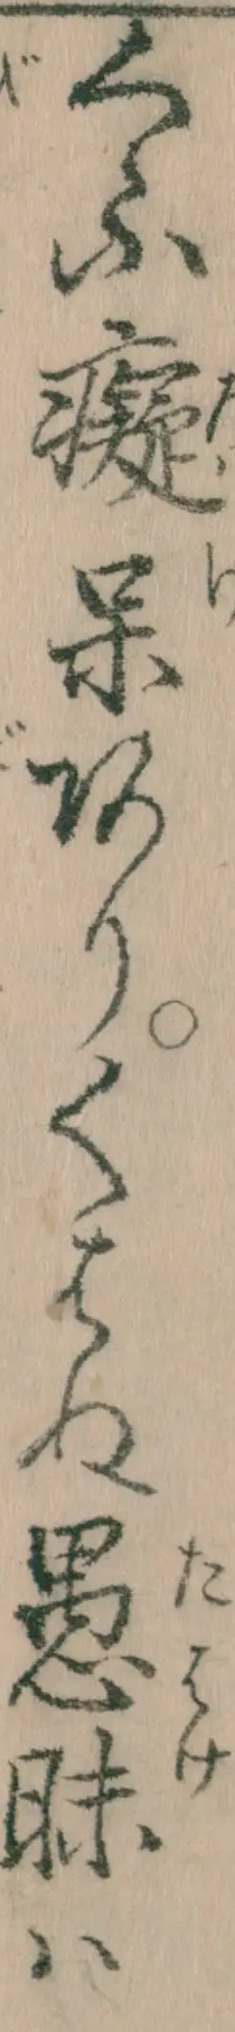くふ癡呆あり。くはぬ愚昧は
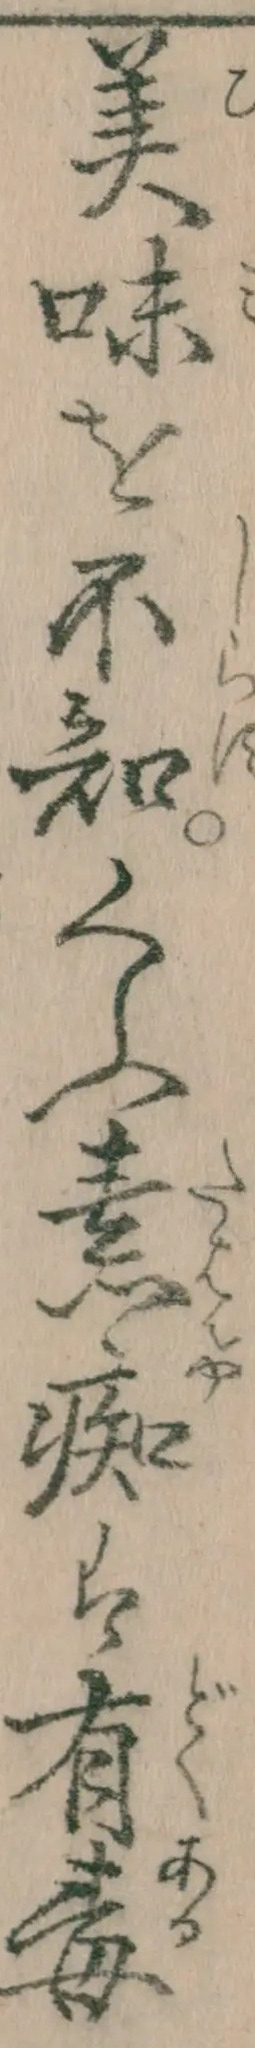美味を不知。くふ素痴は有毒
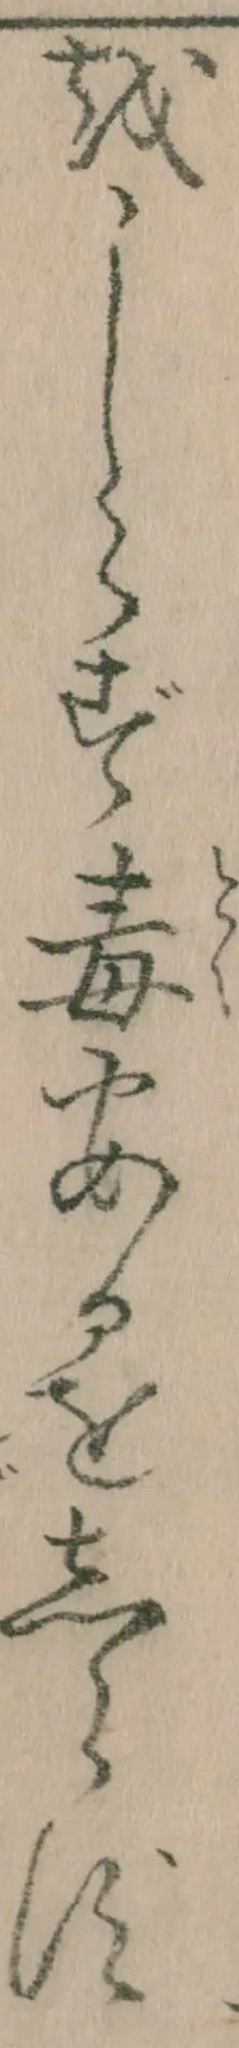をしらず毒あるをしらず
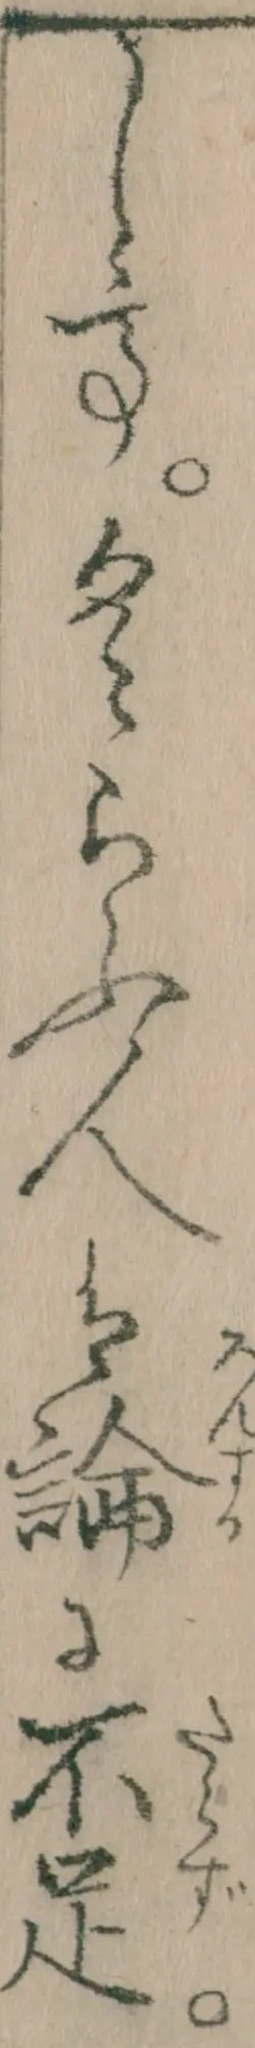して。くらふ人は論に不足。

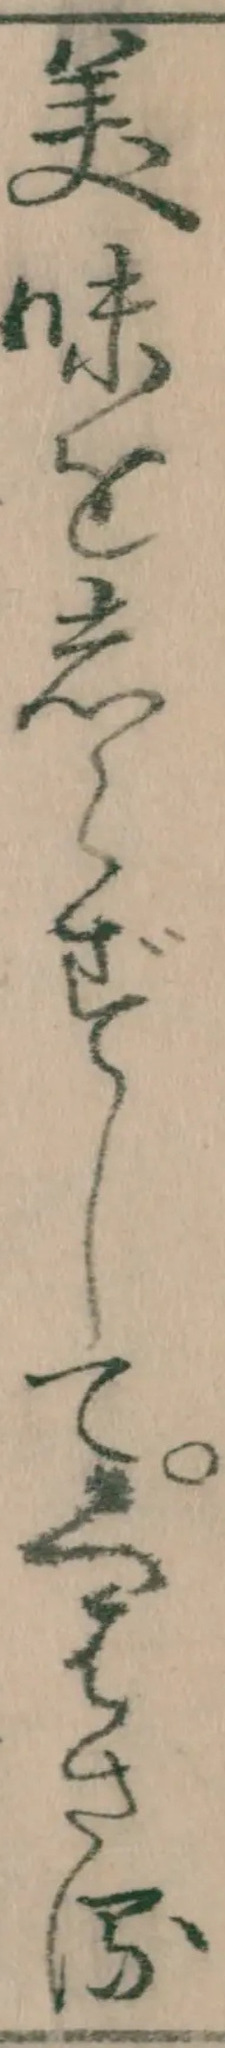美味をしらずして。くはさる
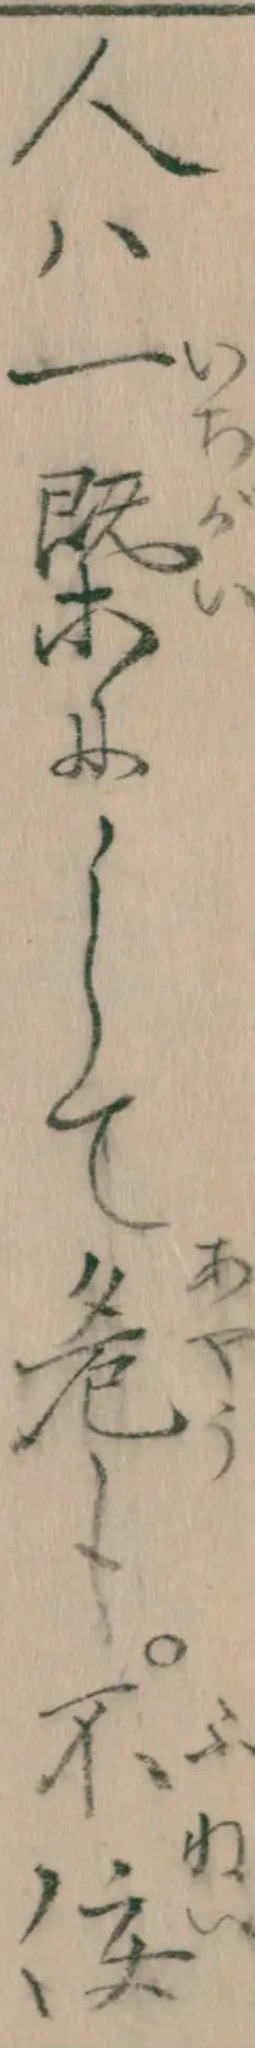人は一概にして危し。不佞
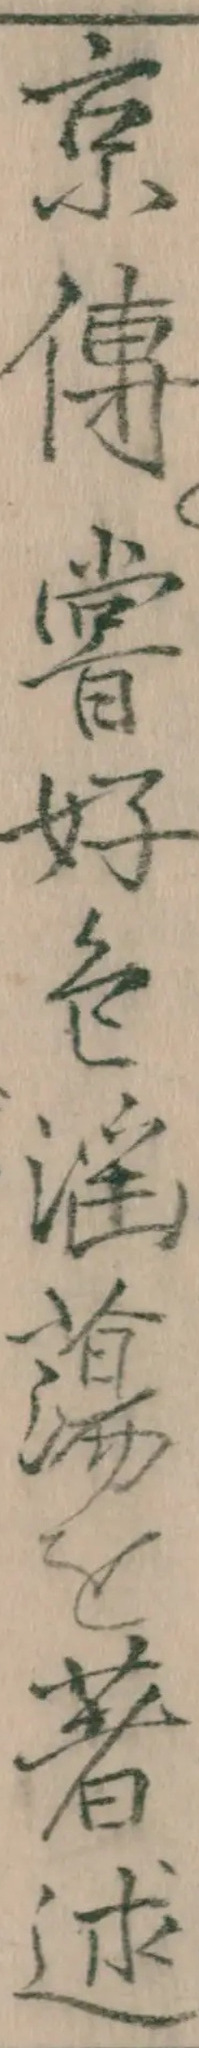京伝。嘗好色淫蕩を著述
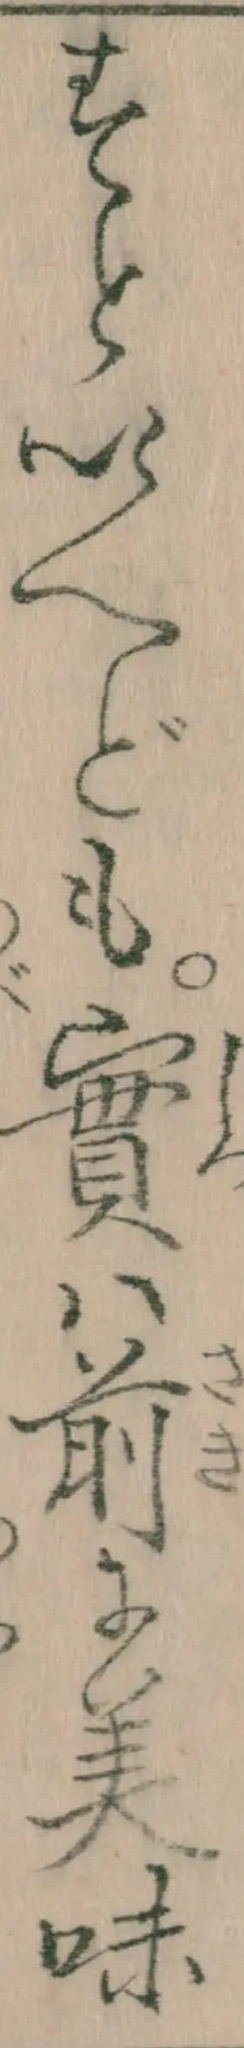すといへども。実は前に美味
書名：教訓読本：大礒風俗仕懸文庫
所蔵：国立国会図書館 National Diet Library, JAPAN
